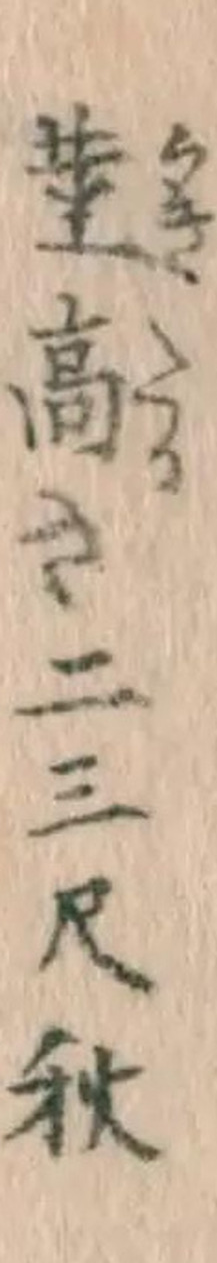茎高さ二三尺秋
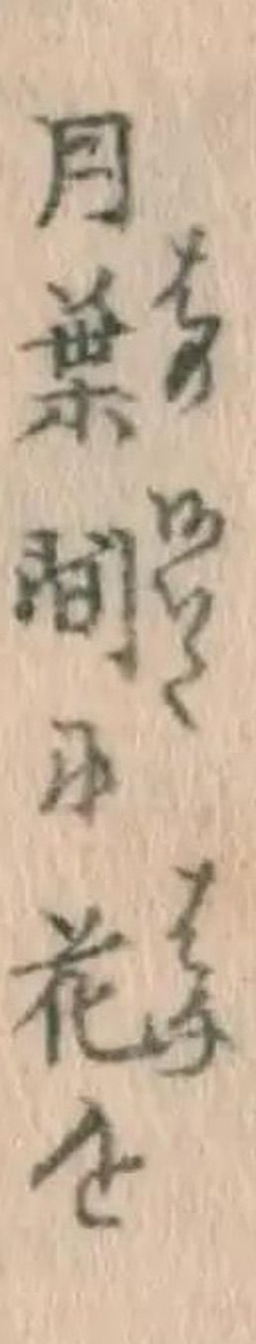月葉間に花を
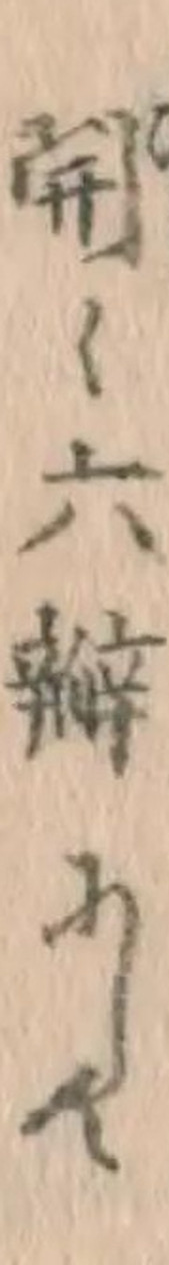開く六弁にして
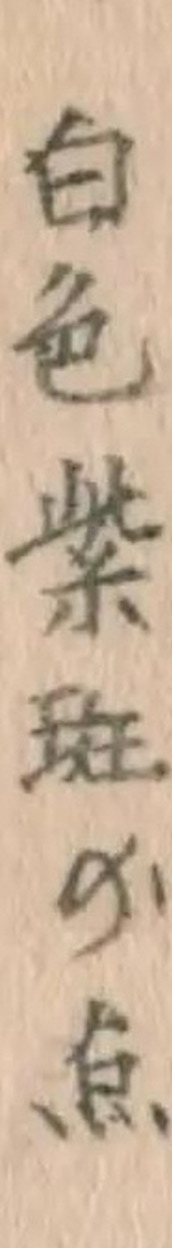白色紫斑の点

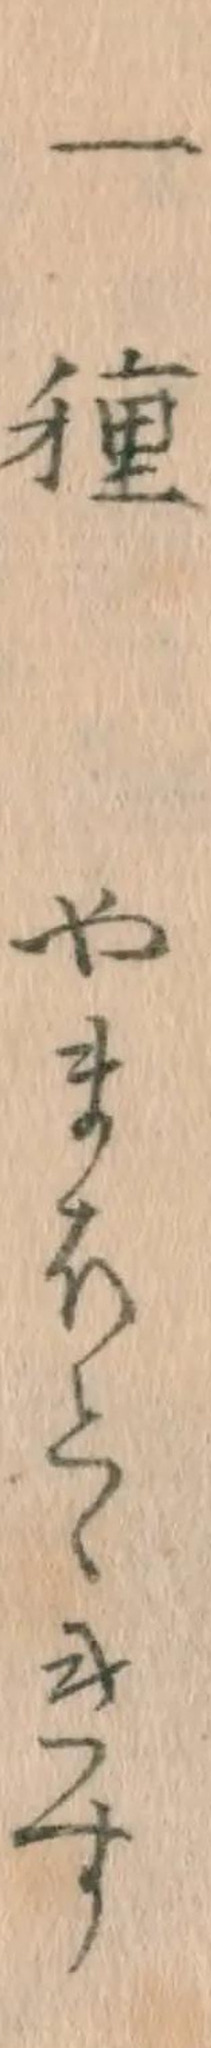一種やまほとゝきす
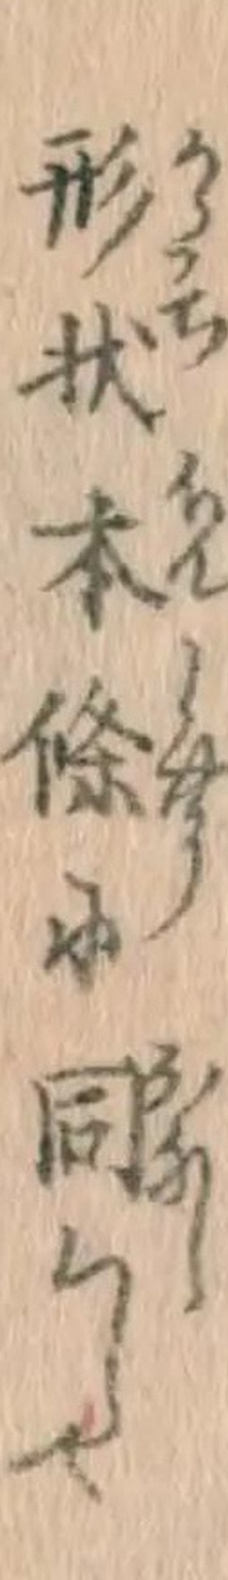形状本条に同くして
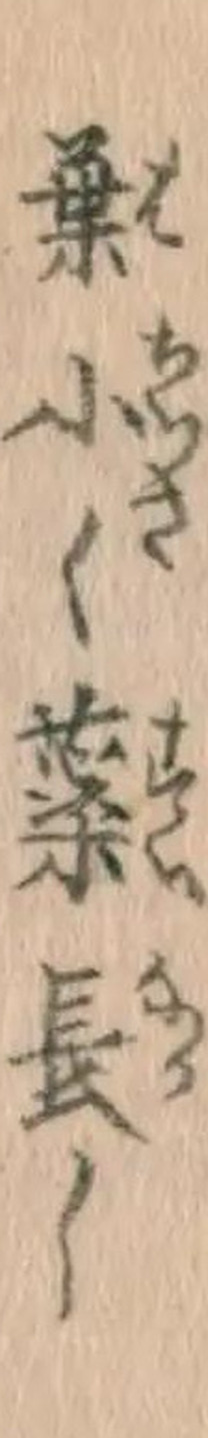葉小く蕊長し
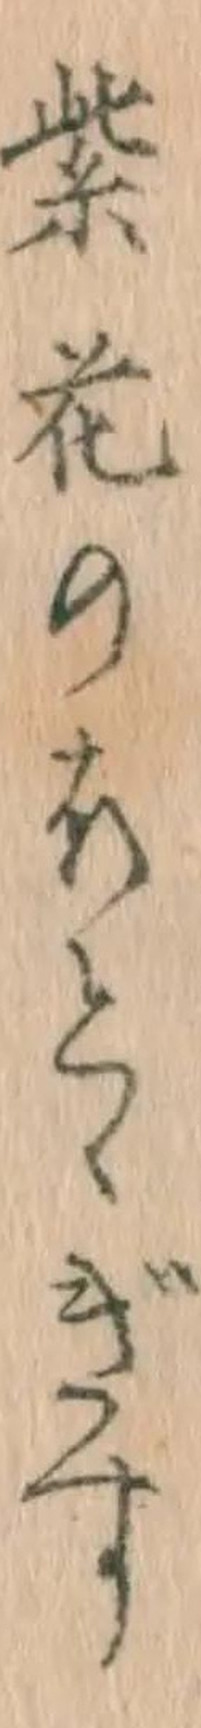紫花のほとゝぎす
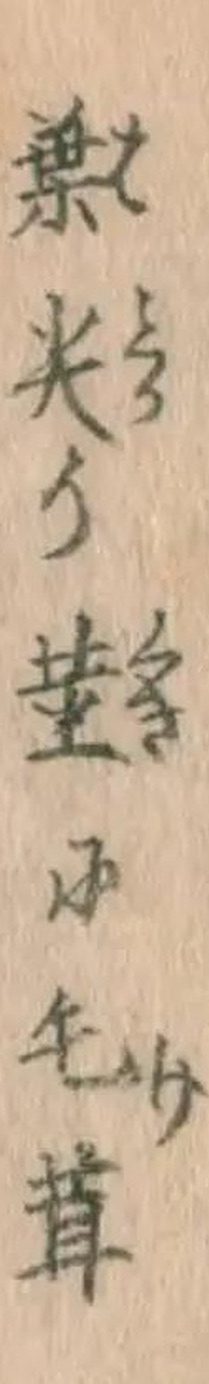葉尖り茎に毛茸
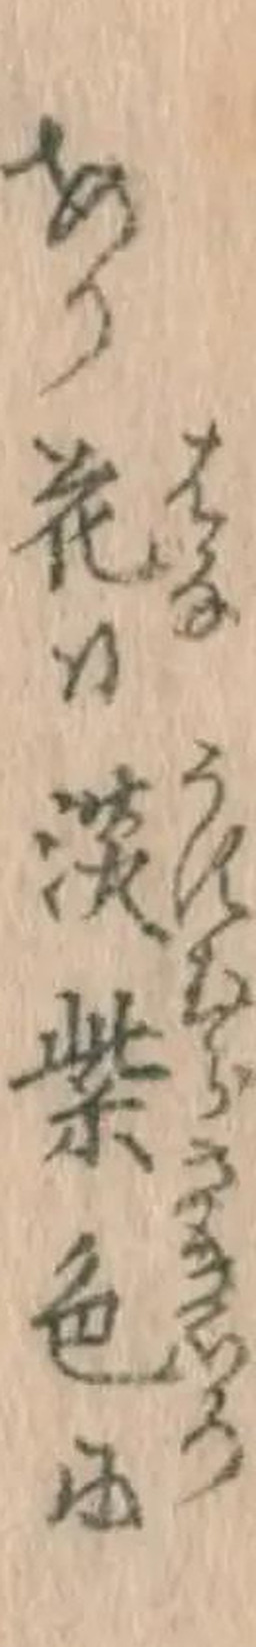あり花は淡紫色に
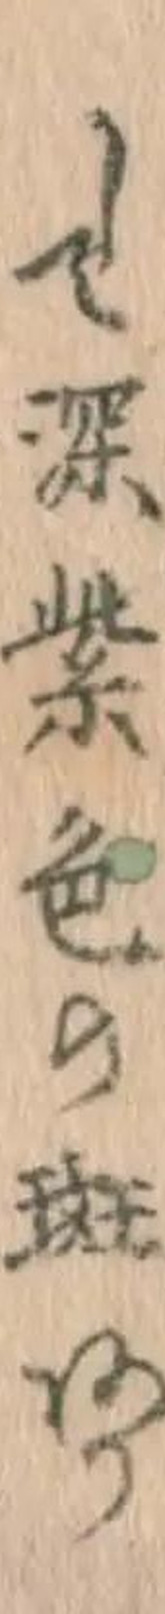して深紫色の斑あり

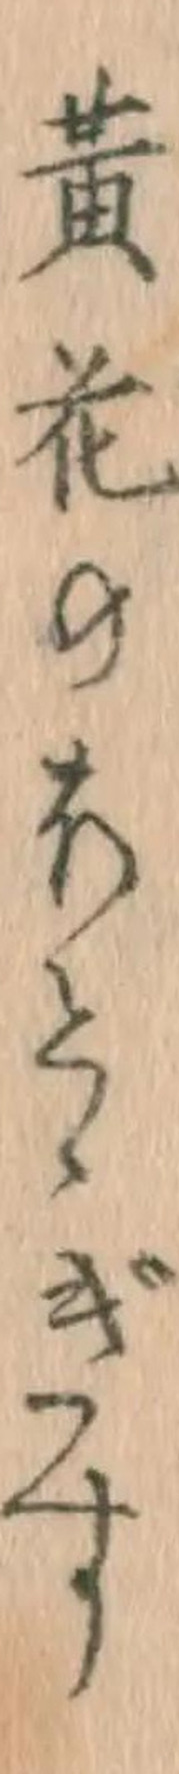黄花のほとゝぎす
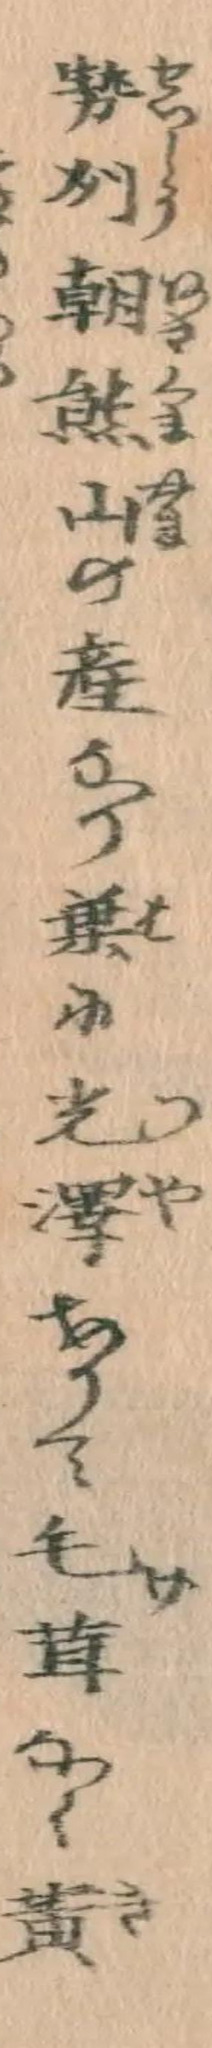勢州朝熊山の産なり葉に光沢ありて毛茸なく黄
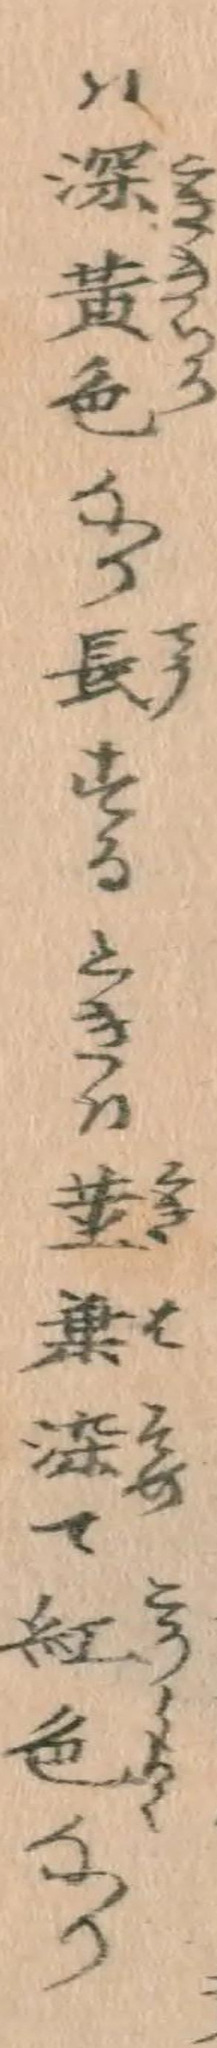は深黄色なり長するときは茎葉染て紅色なり
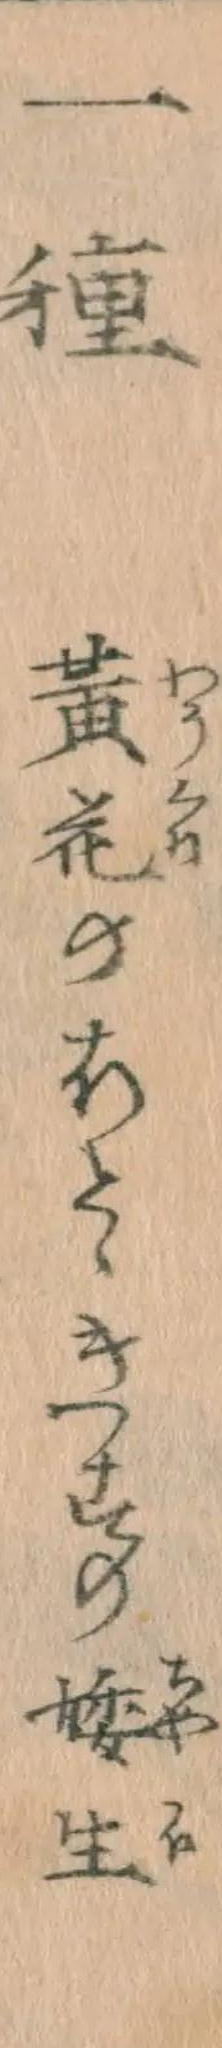一種黄花のほとゝきすの婑生
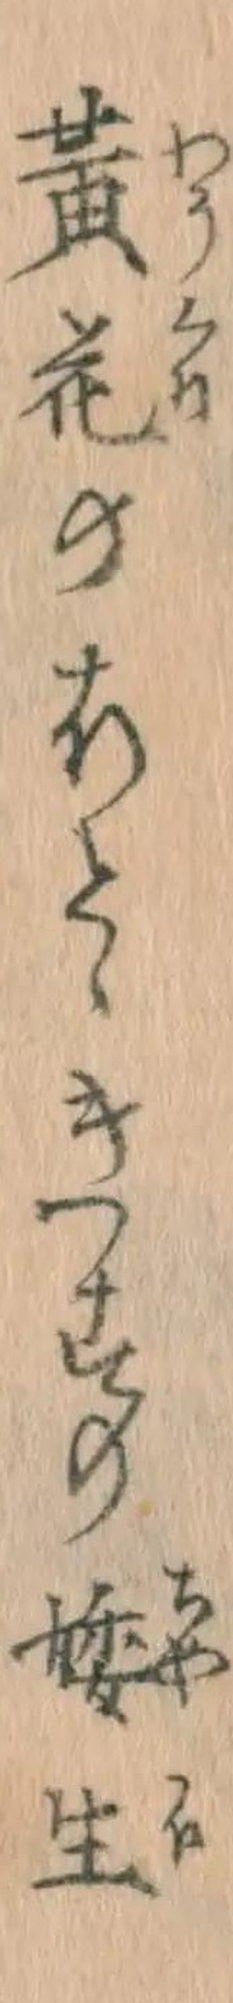一種黄花のほとゝきすの婑生
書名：本草図譜. 巻37-39
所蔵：国立国会図書館 National Diet Library, JAPAN
